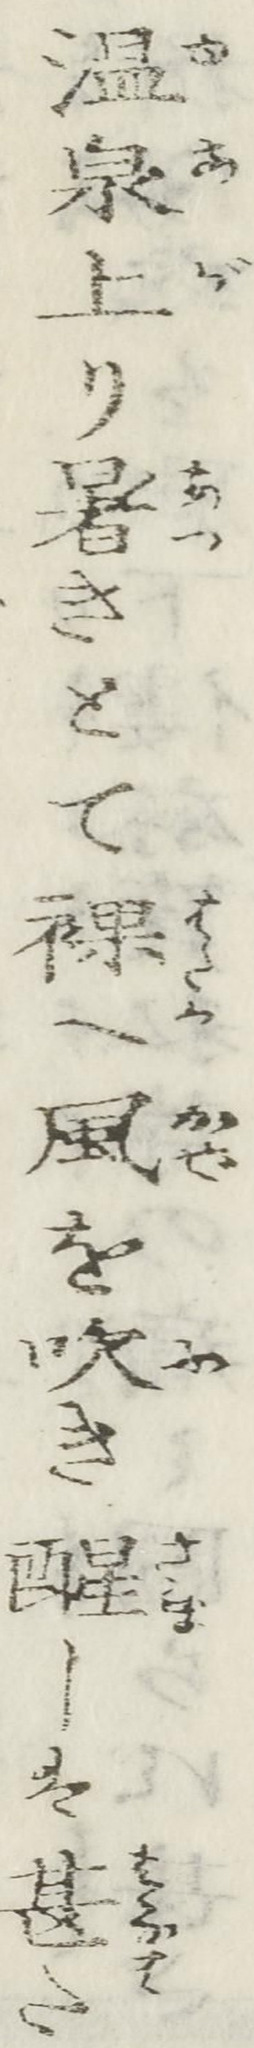温泉上り暑さとて裸へ風を吹き醒しは甚た
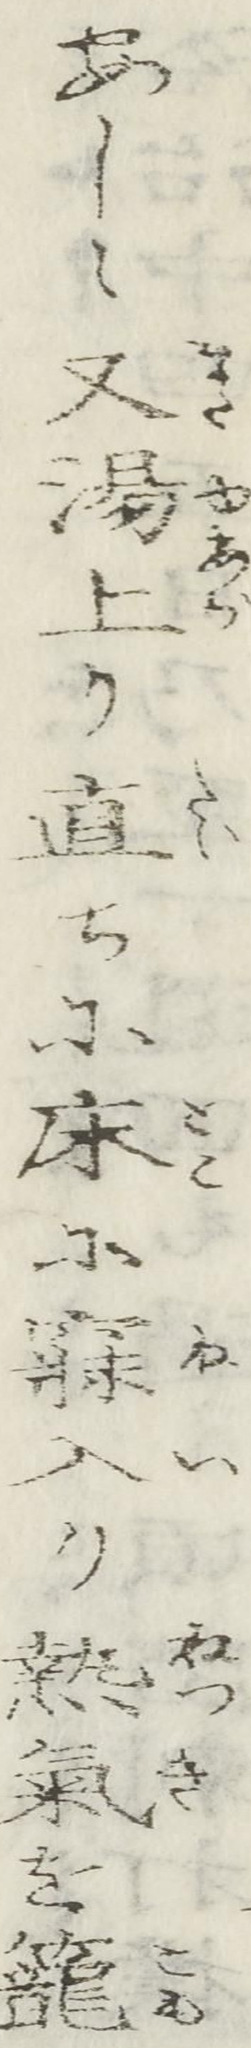あしく又湯上り直ちに床に寐入り熱気を籠
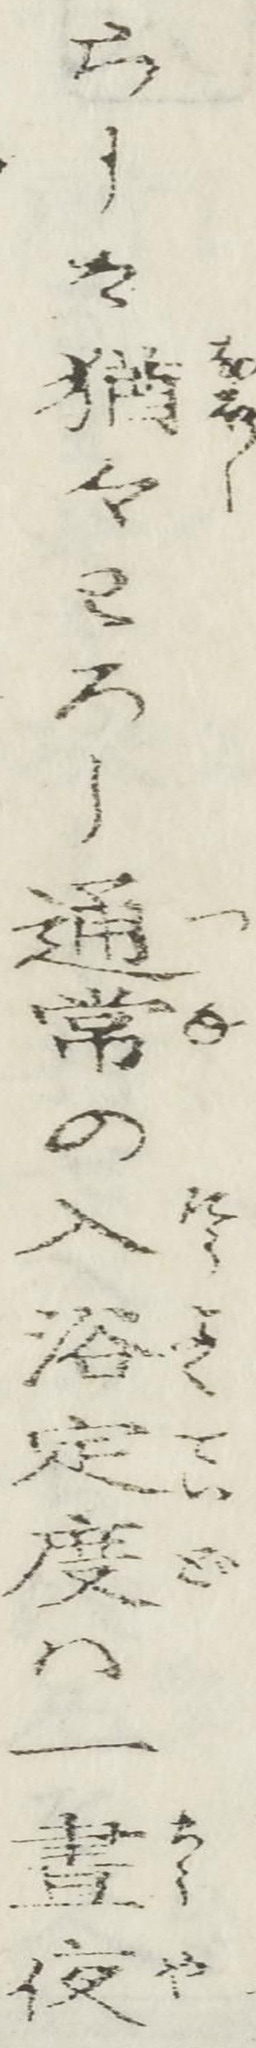らして？猶々わろし通常の入浴定度の一昼夜
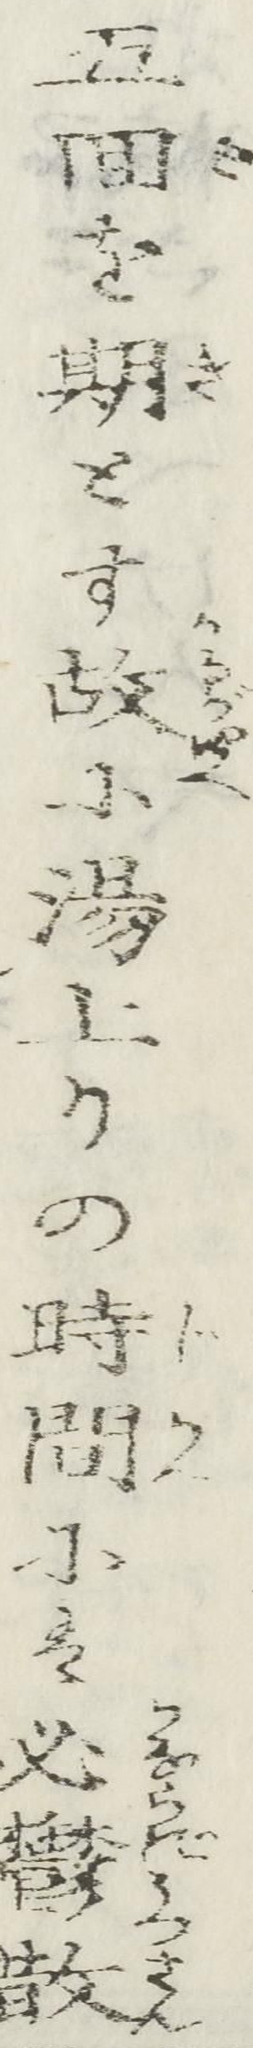五回を期とす故に湯上りの時間には必鬱散
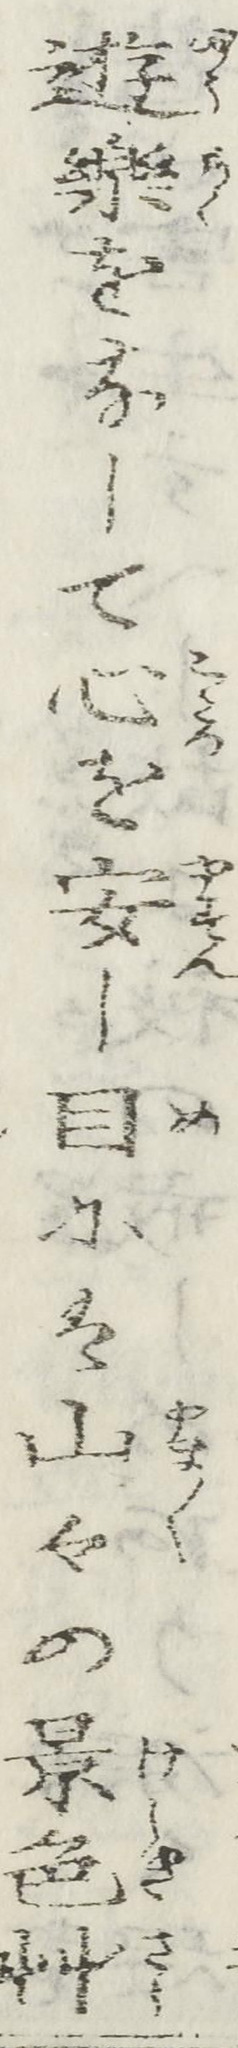遊楽をなして心を安し目には山々の景色艸
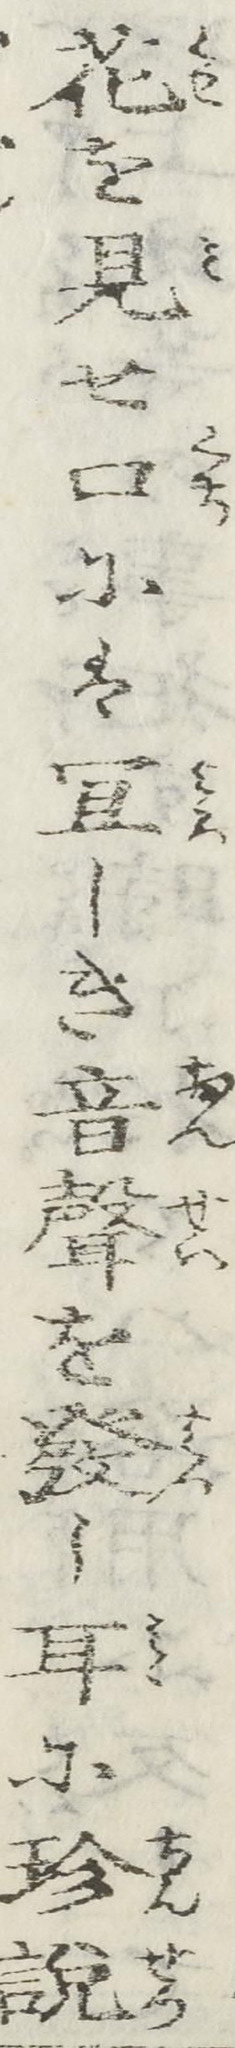花を見せ口には宜しき音声を発し耳に珍説
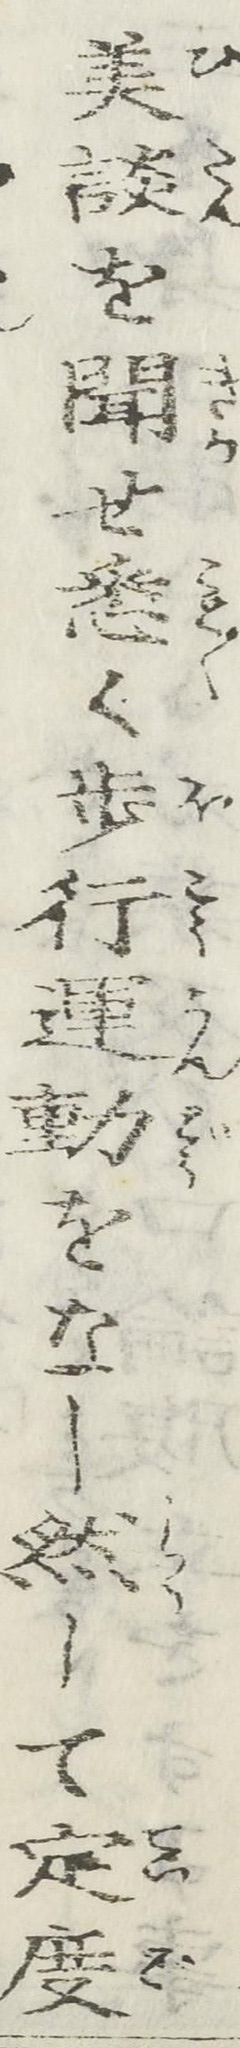美談を聞せ悉く歩行運動をなし然して定度
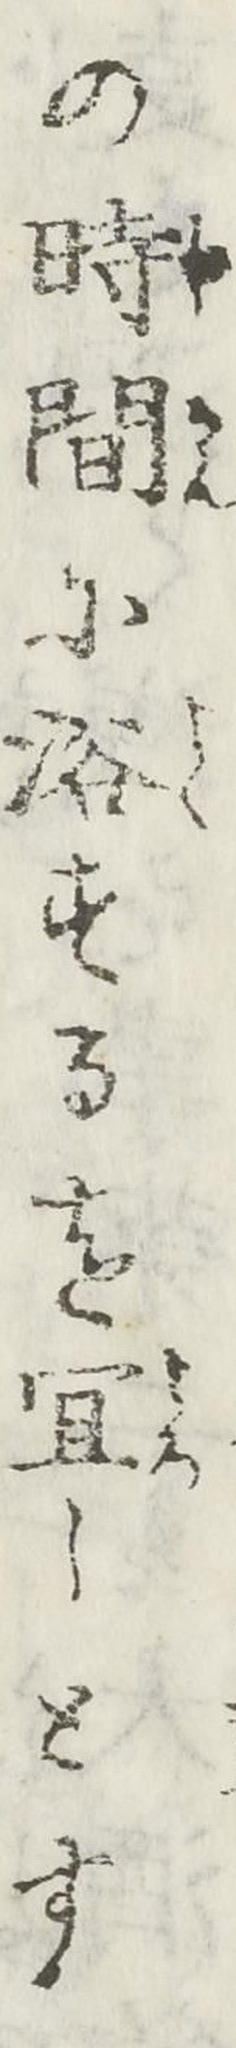の時間に浴するを宜しとす

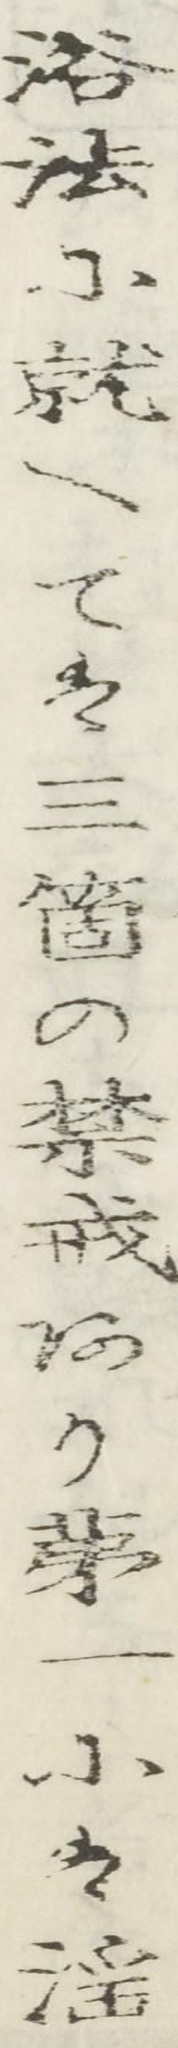浴法については三箇の禁戒あり第一には淫
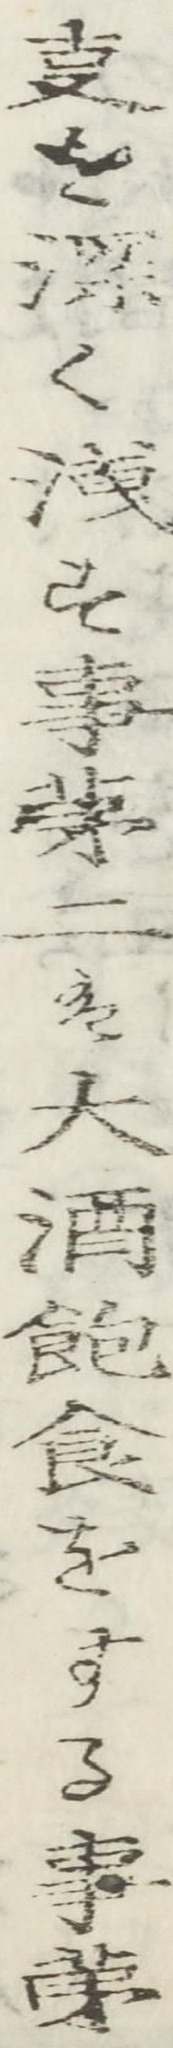事を深く洩す事第二も大酒飽食をする事第
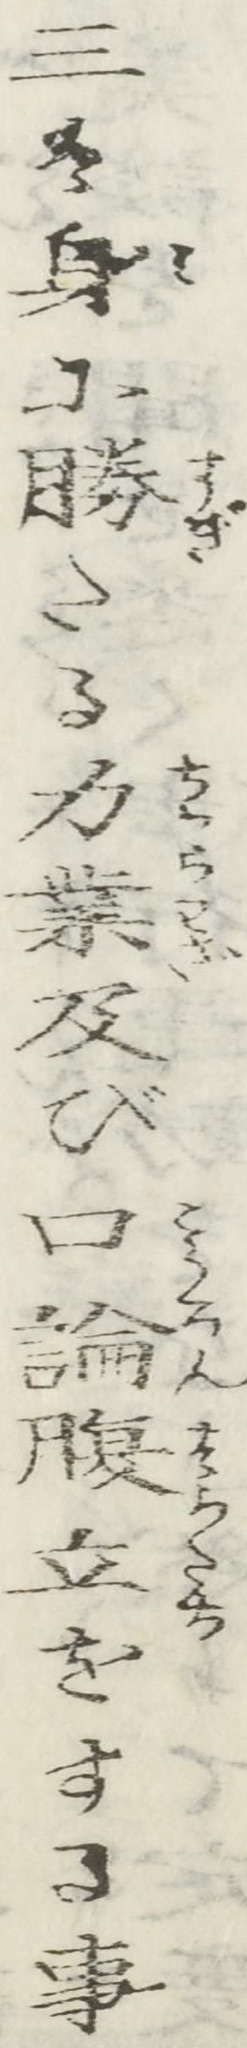三は身に勝たる力業及び口論腹立をする事
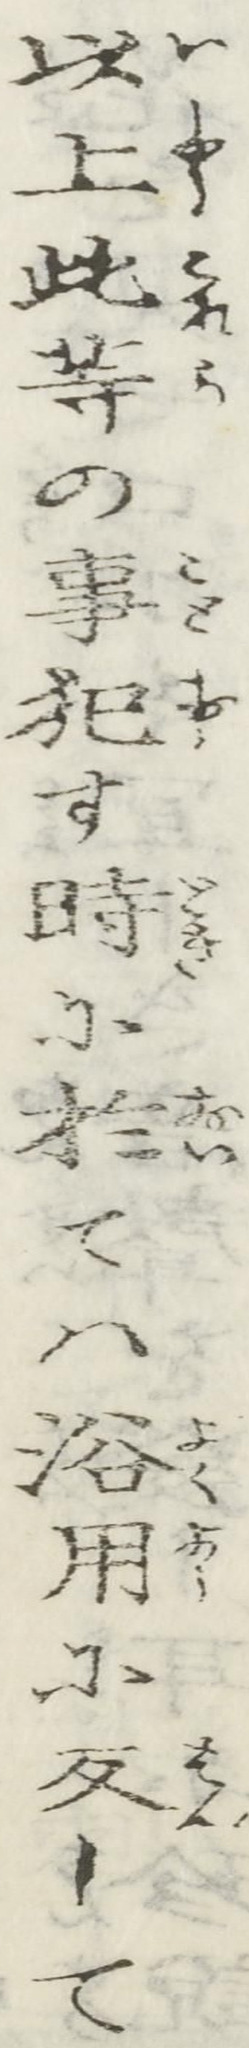以上此等の事犯す時に於ては浴用に反して
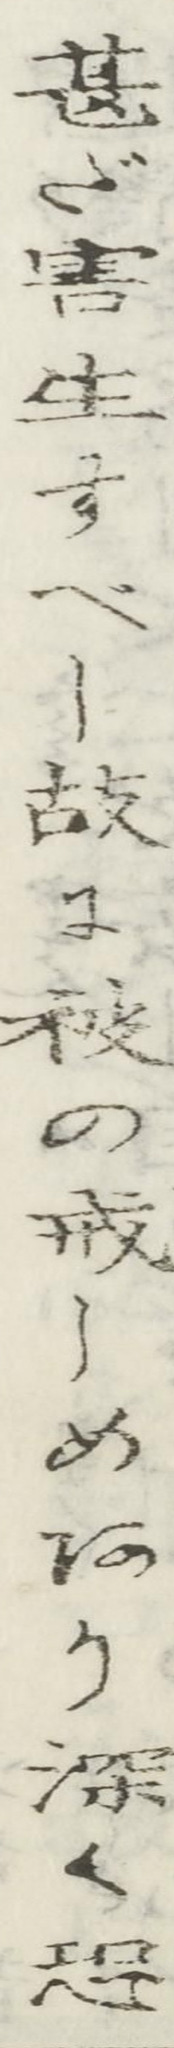甚だ害生すべし故に被の戒しめあり深く恐
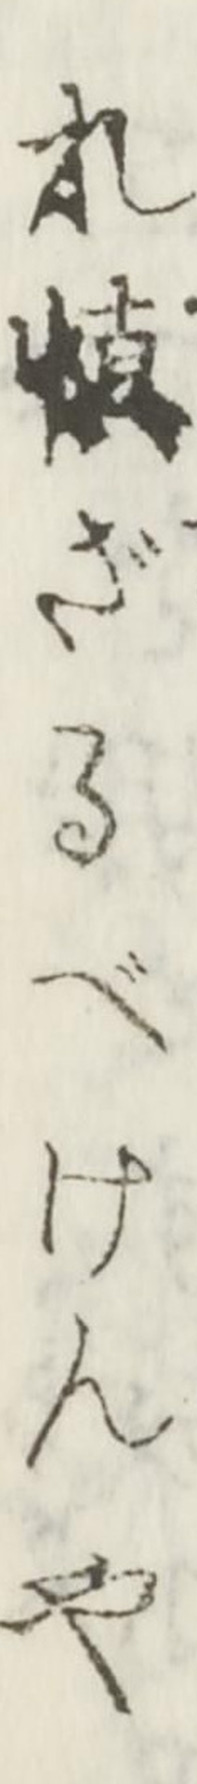れ慎ざるべけんや
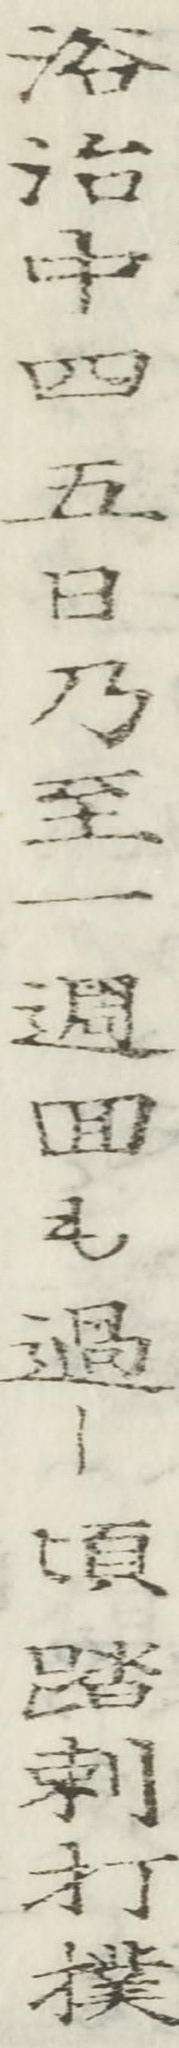浴治中四五日乃至一週回も過し頃踏刺打撲
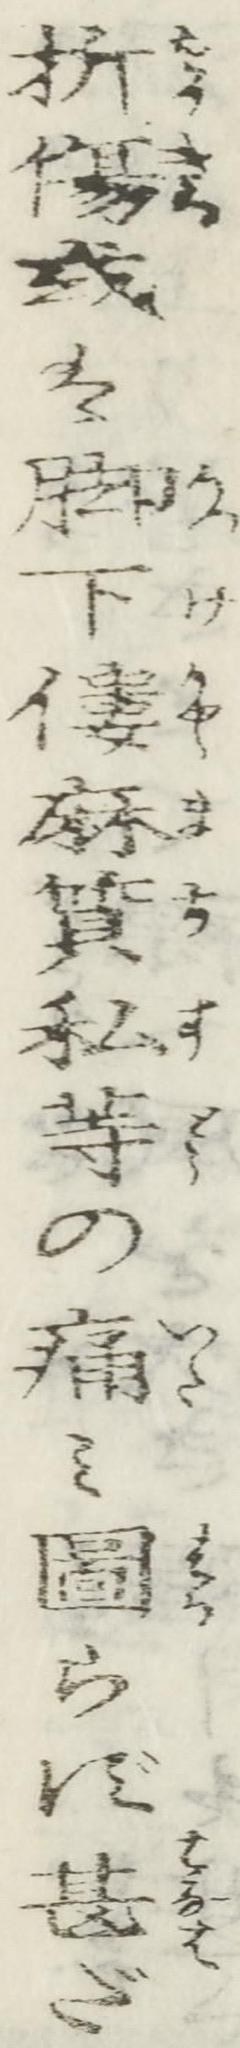折傷或は脚気僂麻質私等の痛み図らず甚だ
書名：鎌先温泉由來記
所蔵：東京大学地震研究所図書室 Earthquake Research Institute Library, The University of Tokyo, JAPAN
